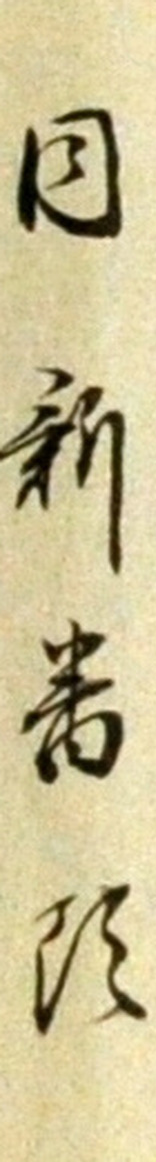同新番頭
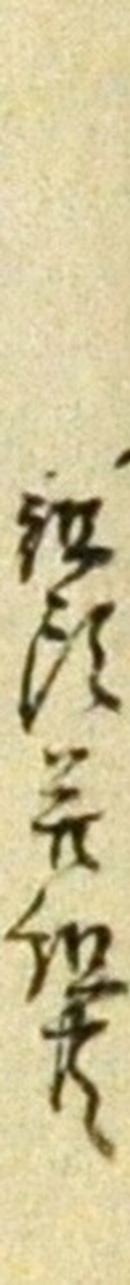組頭幷組共
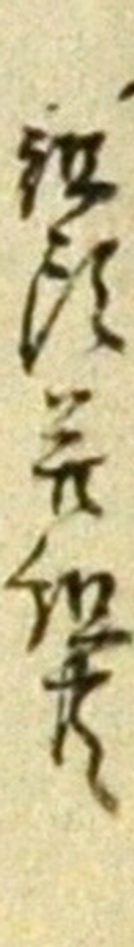組頭幷組共
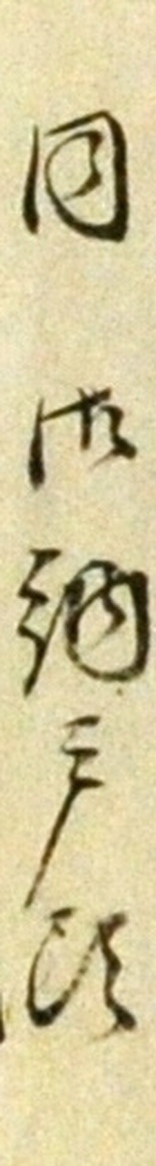同御納戸頭
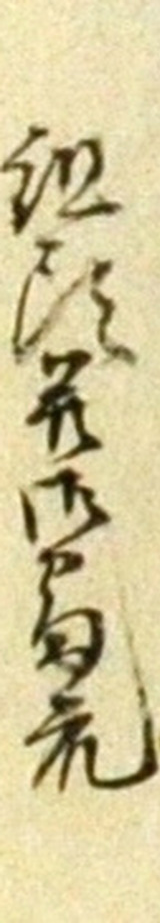組頭并御番衆
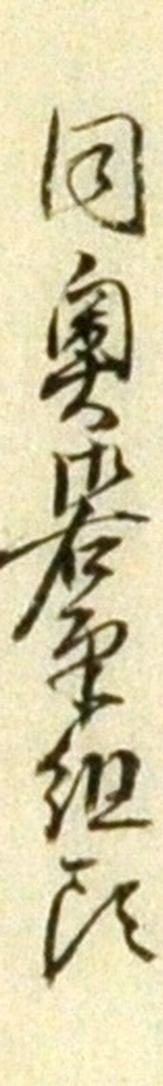同奥御右筆組頭
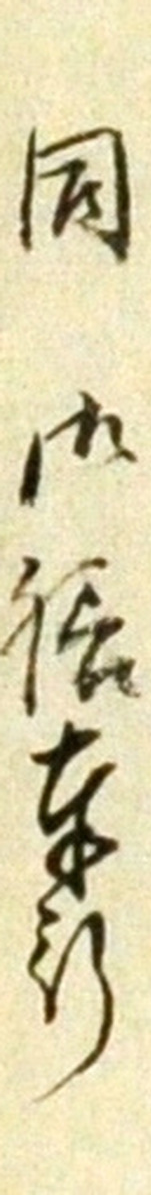同御鎗奉行
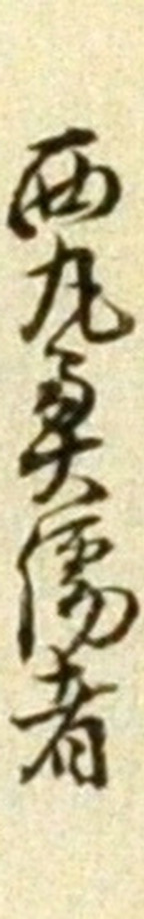西丸奥儒者
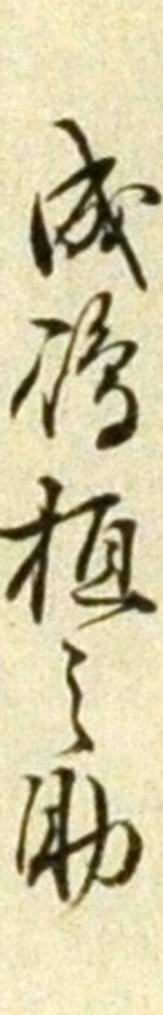成増桓之助
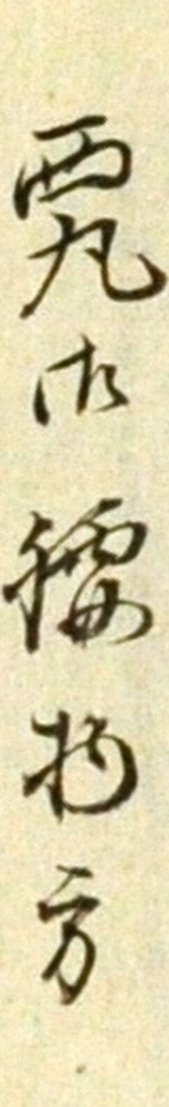西丸御腰物方
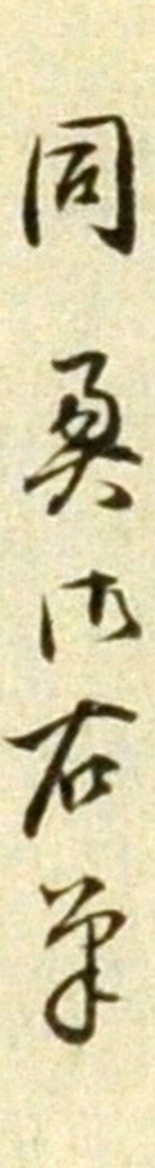同奥御右筆
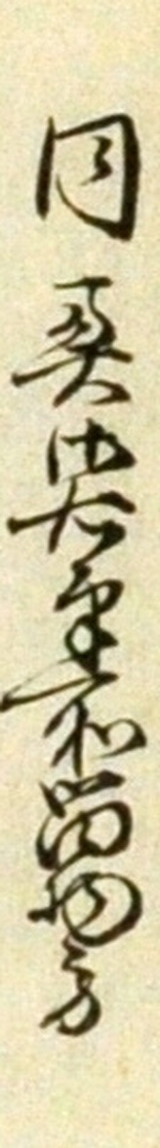同奥御右筆所器物方
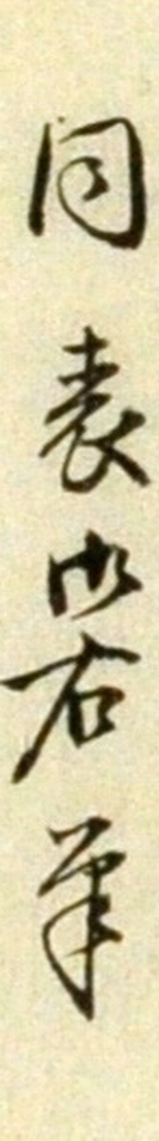同表御右筆
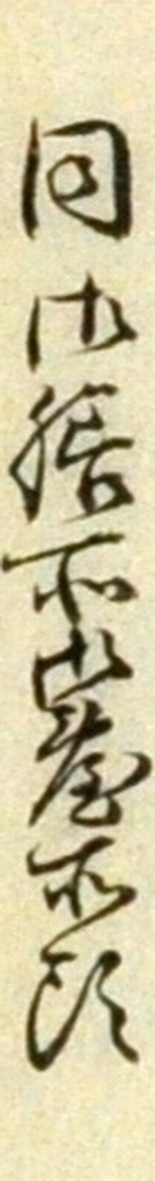同御膳所御臺所頭
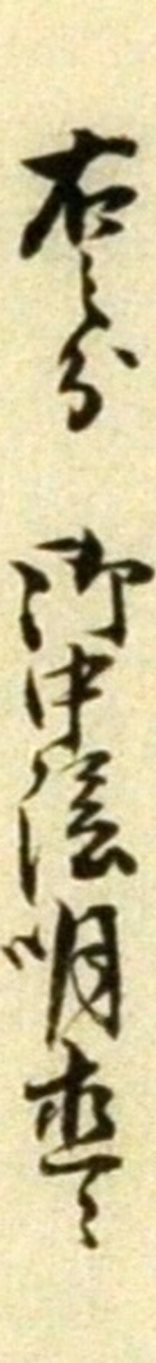右之分御中陰明直ニ
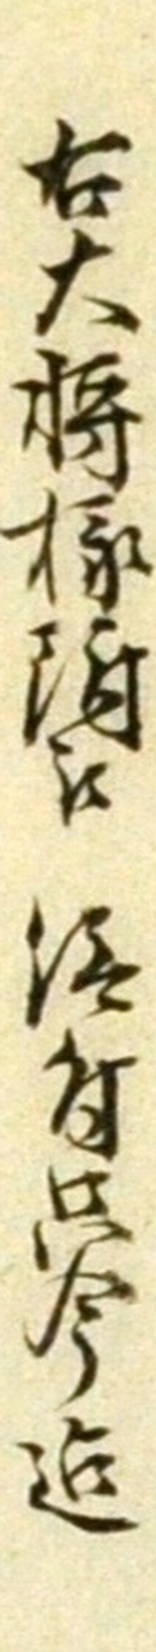右大将様附被仰付只今迄
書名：若年寄御役中御調書付
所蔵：伊那市立高遠町図書館・合同会社AMANE
